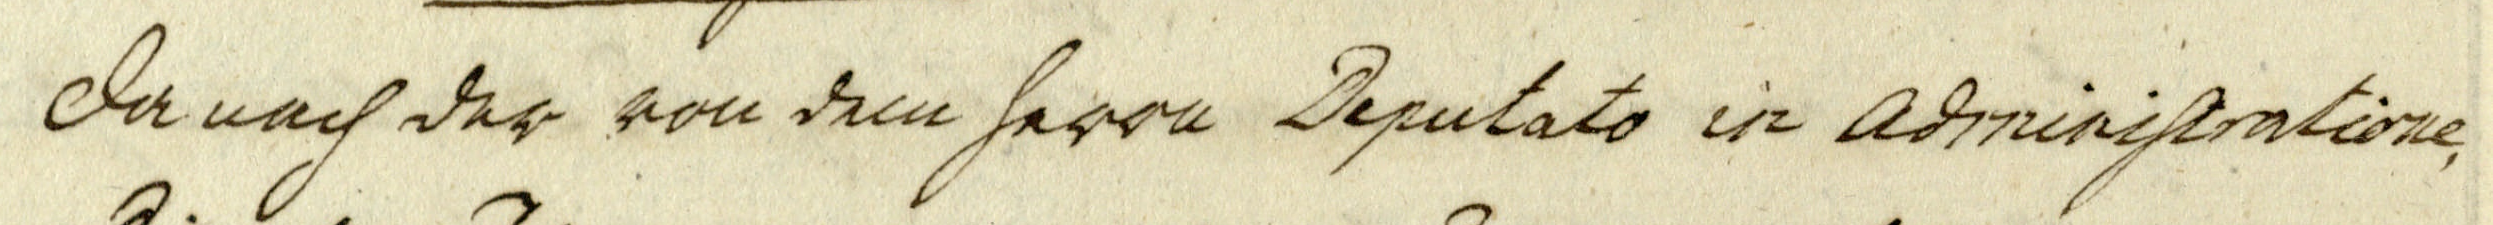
Da nach der von dem herrn Deputato in Administratione,
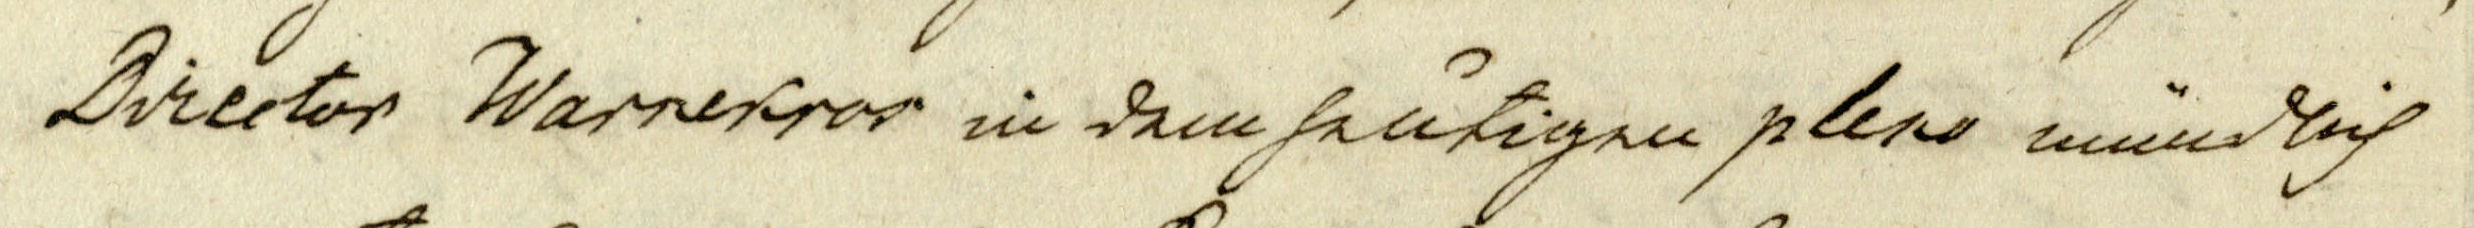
Director Warnekros in dem heutigen pleno mündlich
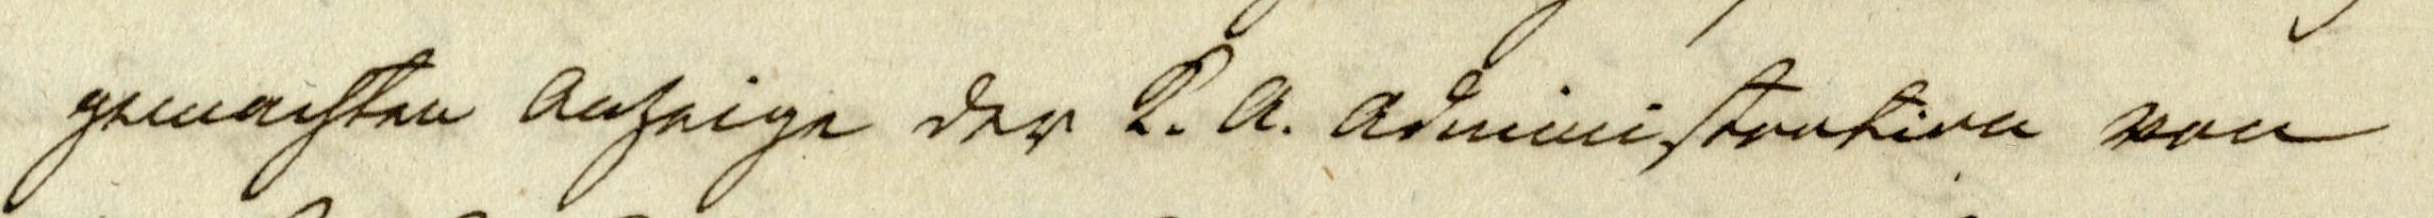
gemachten Anzeige der K. A. Administration von
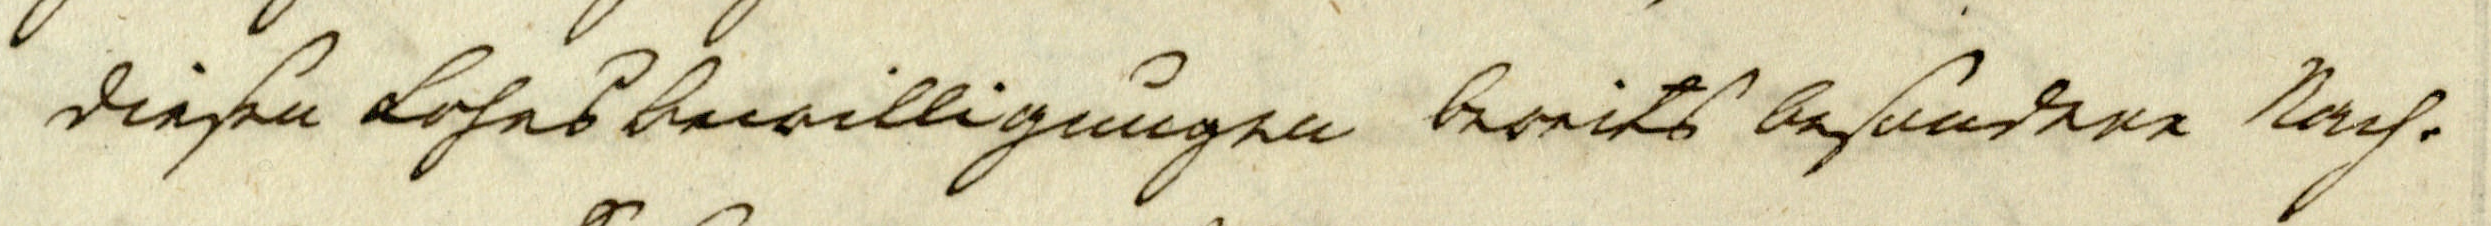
diesen Lohnsbewilligungen bereits besondere Nach¬
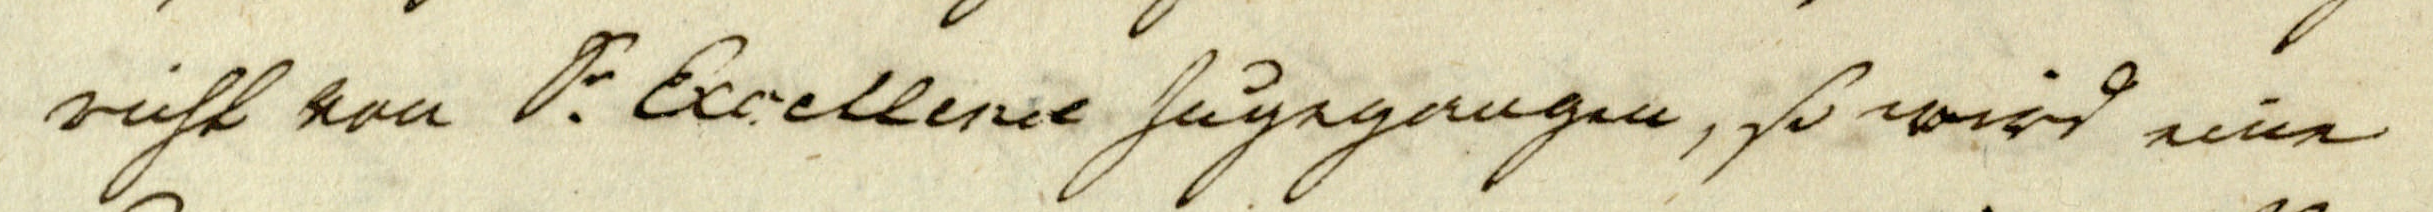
richt von Sr. Excellence zugegangen, so wird eine
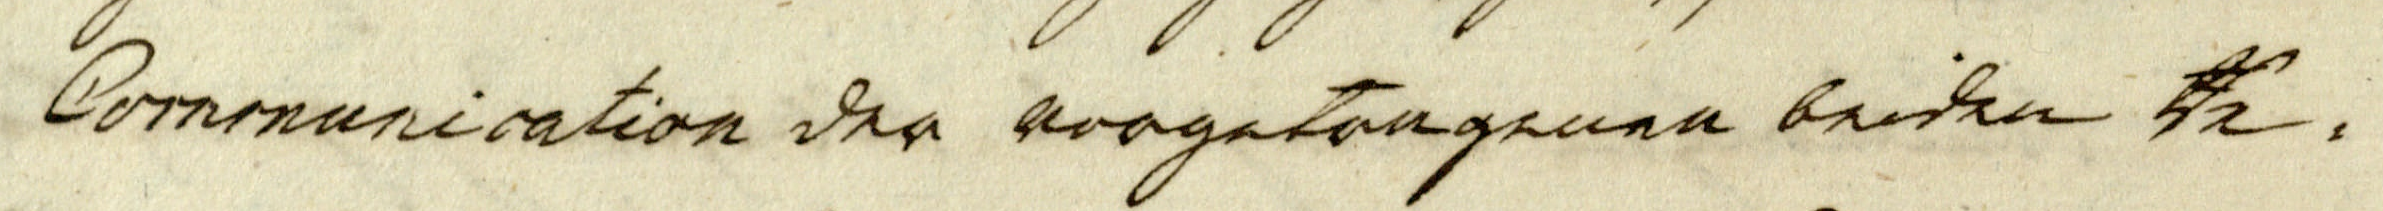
Communication der vorgetragenen beiden Re¬
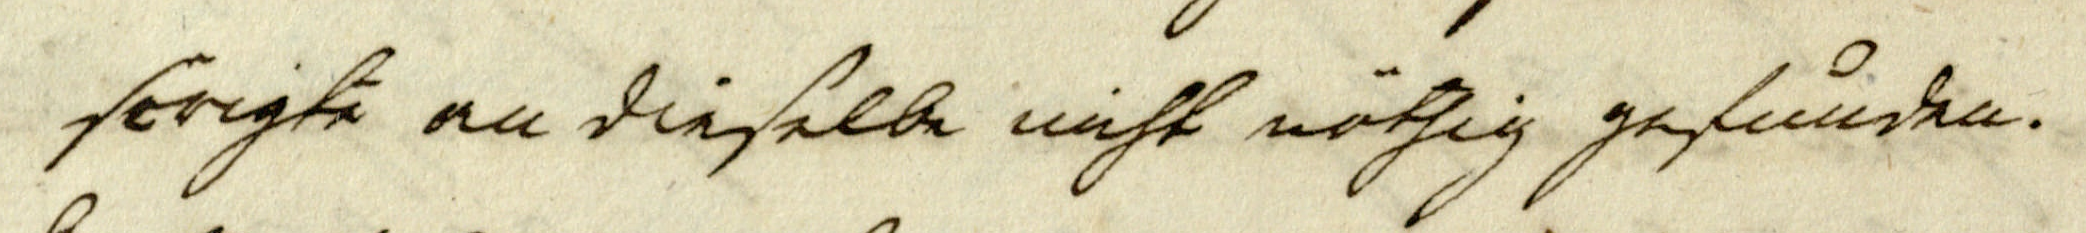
scripte an dieselbe nicht nöthig gefunden.
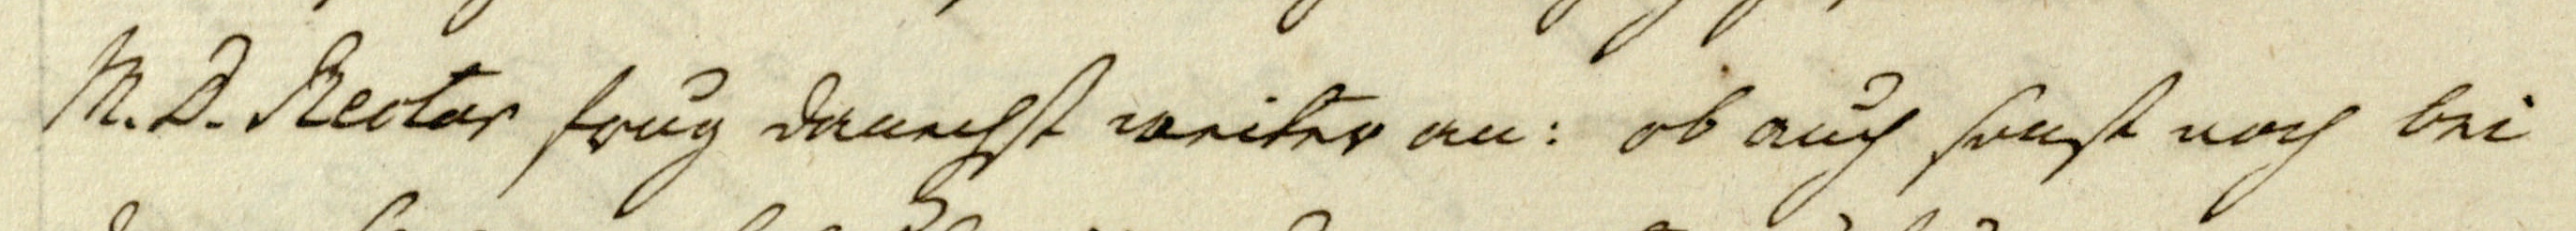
M. D. Rector frug danechst weiter an: ob auch sonst noch bei
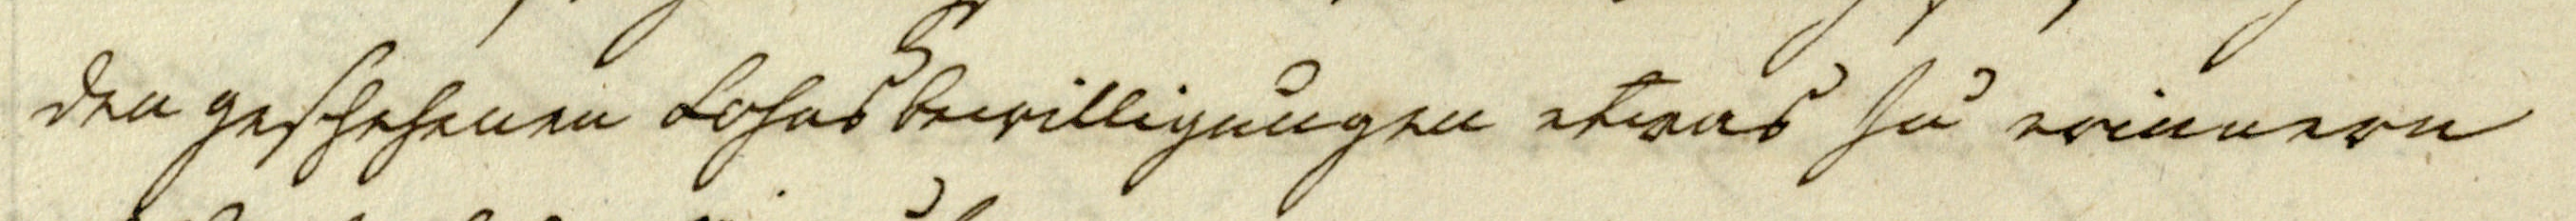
den geschehenen Lohnsbewilligungen etwas zu erinnern
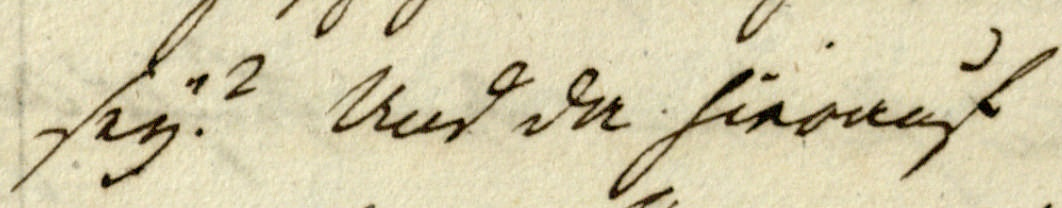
seÿ? Und da hierauf
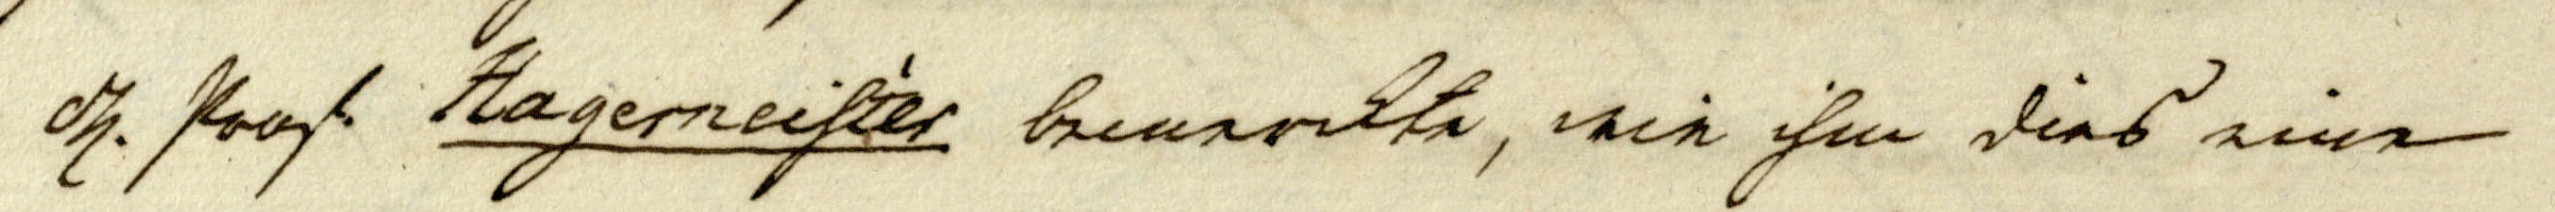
dh. Prof. Hagemeister bemerckte, wie ihm dies eine
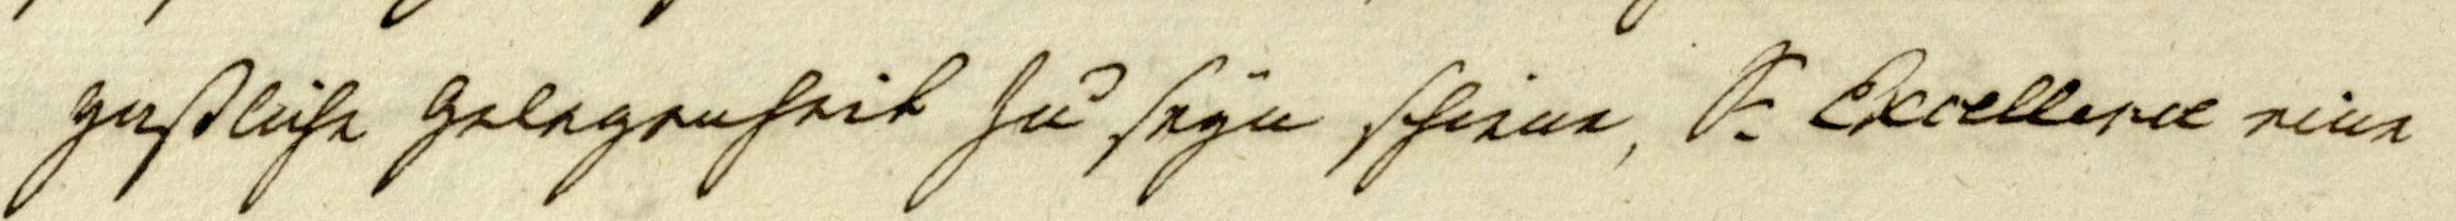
paßliche Gelegenheit zu seÿn schiene, Sr. Excellence eine
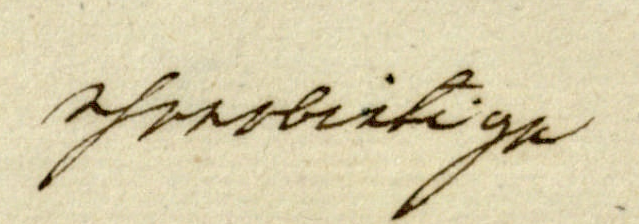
ehrerbietige
